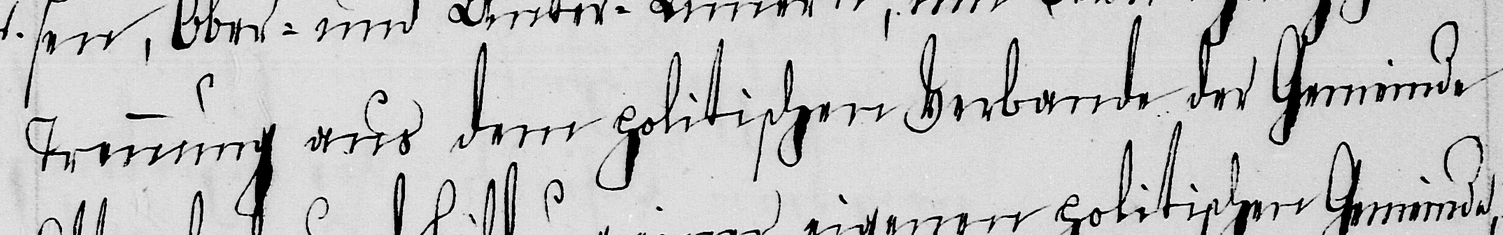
Trennung aus dem politischen Verbande der Gemeinde
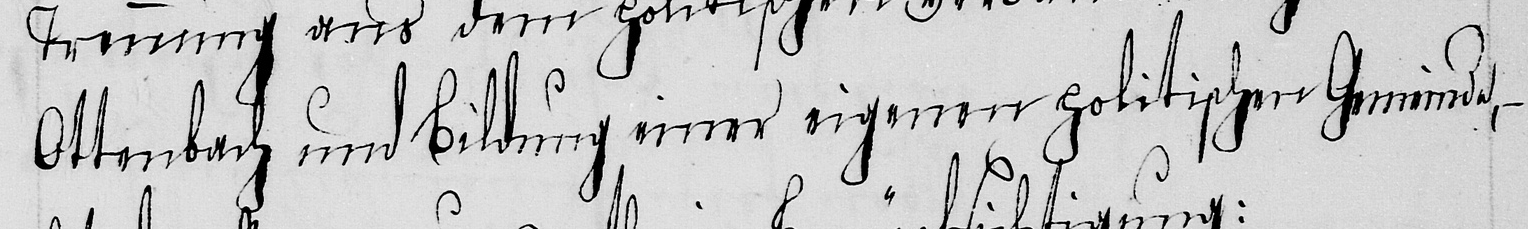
Ottenbach und Bildung einer eigenen politischen Gemeinde,
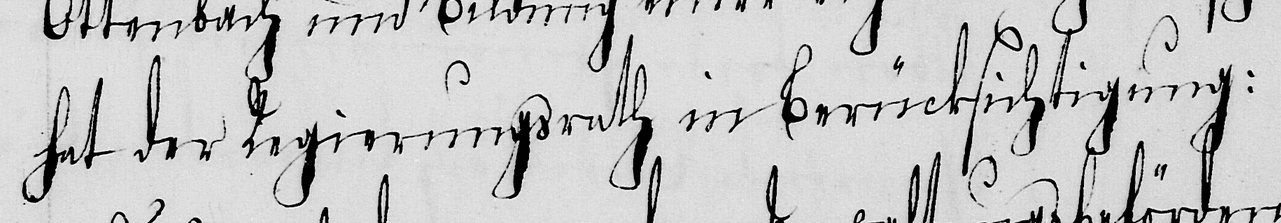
hat der Regierungsrath in Berücksichtigung:
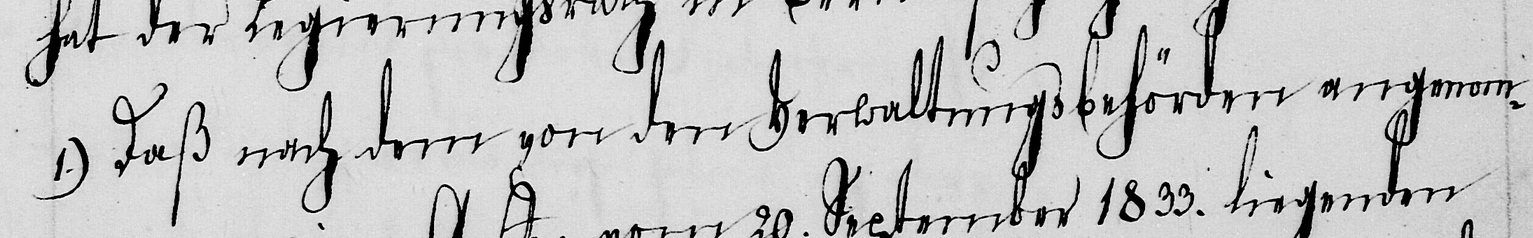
1.) Daß nach dem von den Verwaltungsbehörden angenom¬
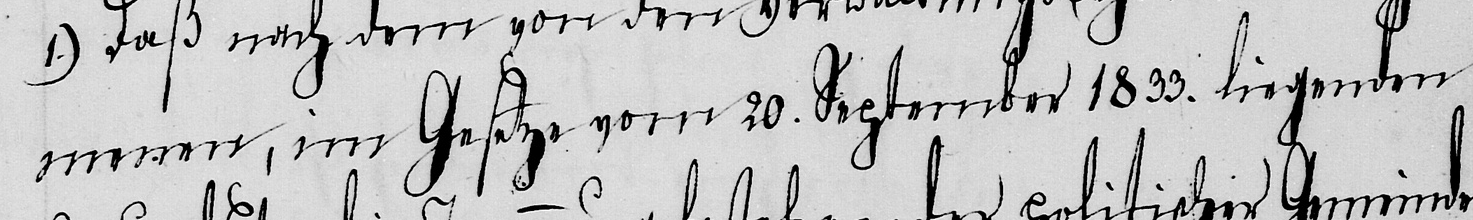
menen, im Gesetze vom 20. September 1833. liegenden
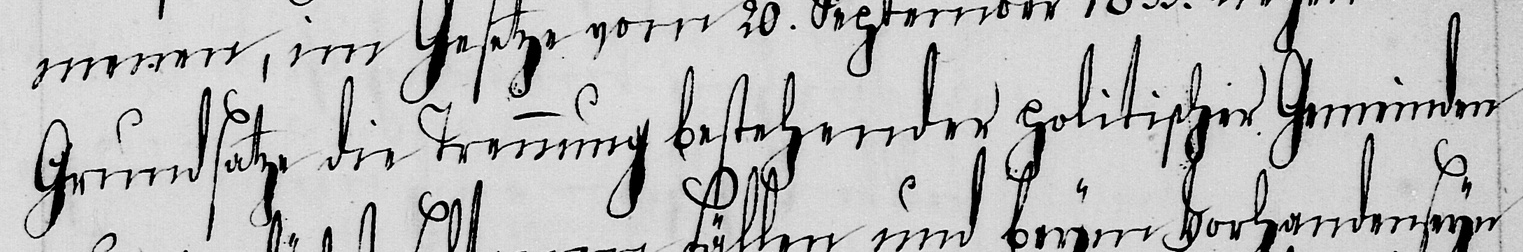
Grundsatze die Trennung bestehender politischer Gemeinden
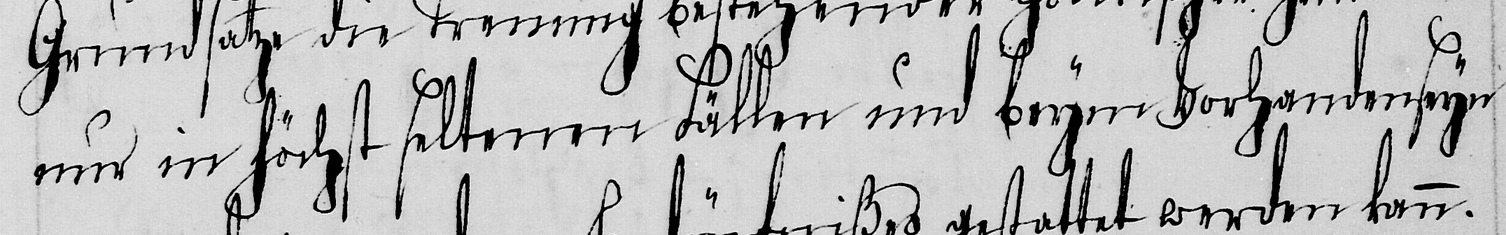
nur in höchst seltenen Fällen und beym Vorhandenseyn
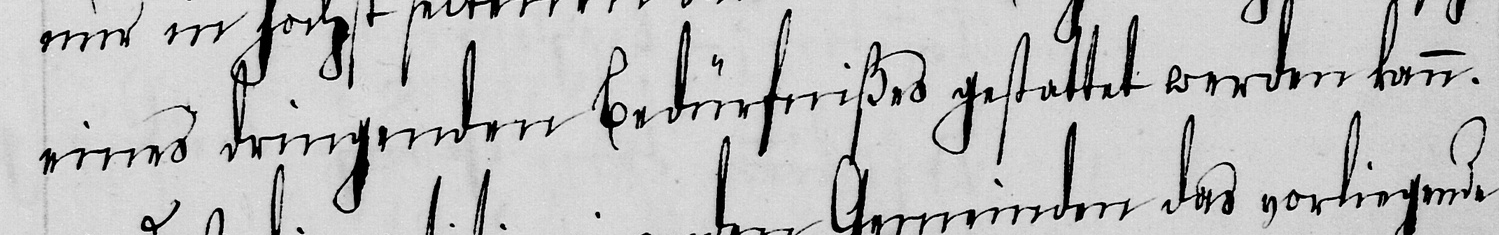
eines dringenden Bedürfnißes gestattet werden kann.
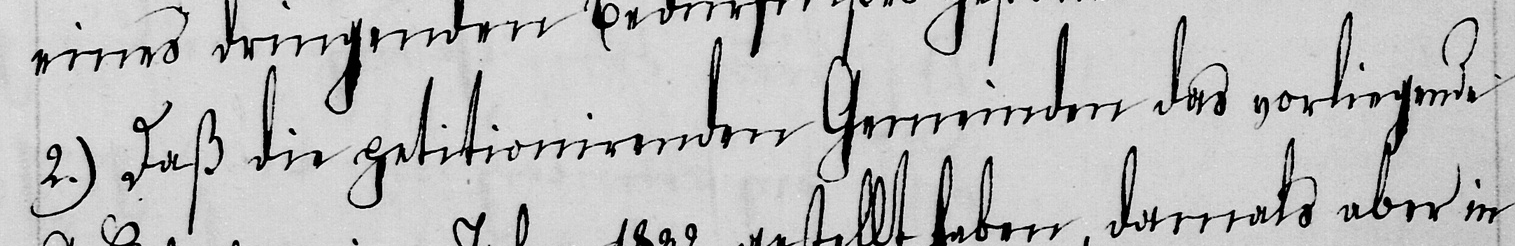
2.) Daß die petitionirenden Gemeinden das vorliegende
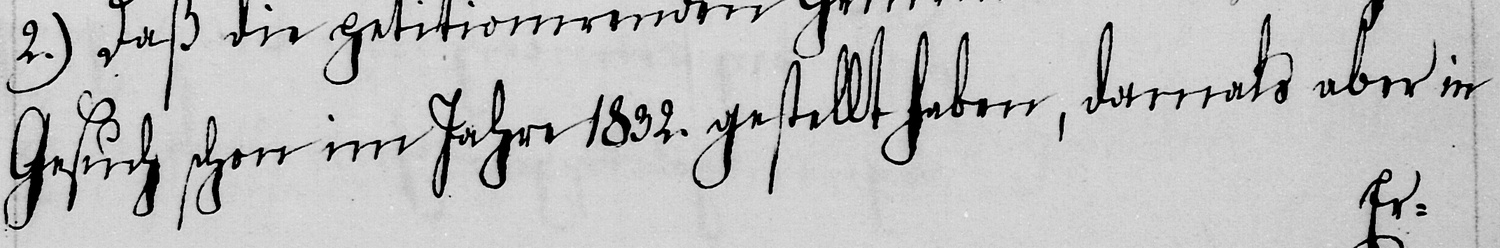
Gesuch schon im Jahre 1832. gestellt haben, damals aber in
